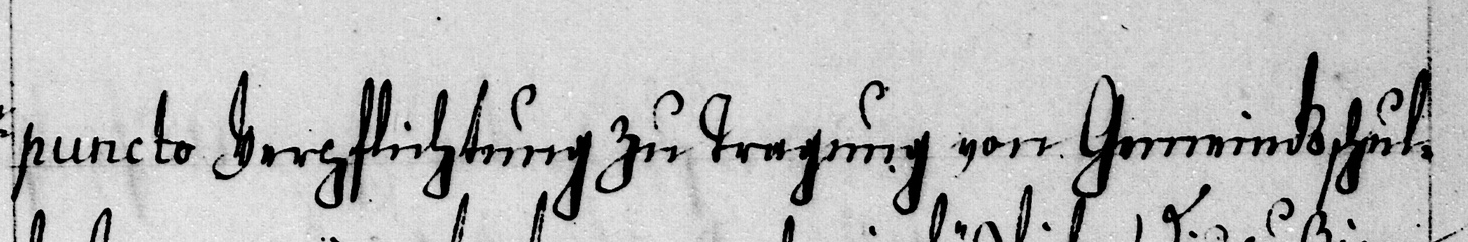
puncto Verpflichtung zu Tragung von Gemeindsschul¬
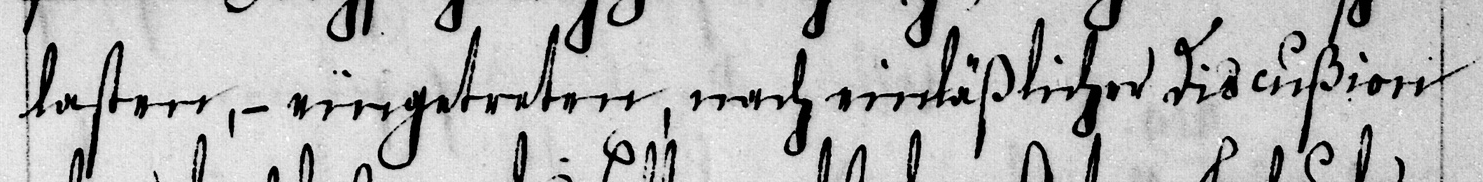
lasten, – eingetreten, nach einläßlicher Discußion
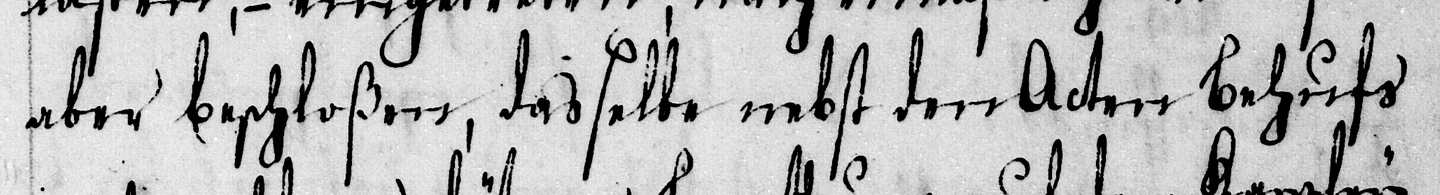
aber beschloßen, dasselbe nebst den Acten Behufs
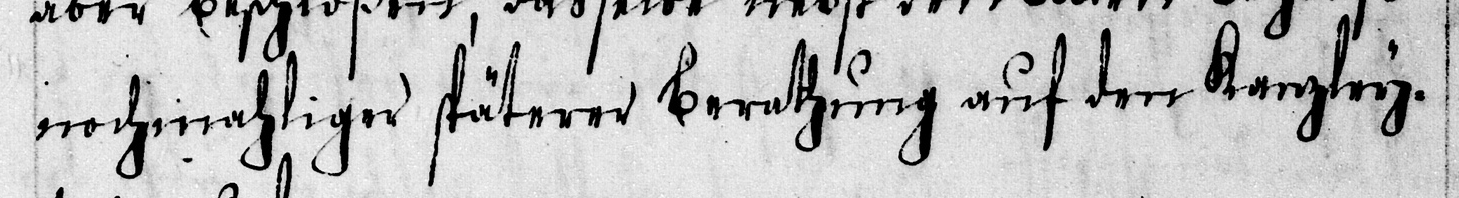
nochmahliger späterer Berathung auf den Kanzley¬
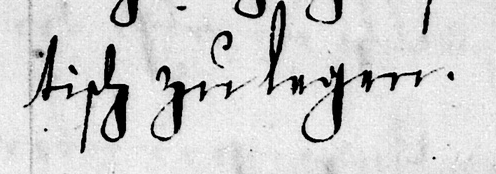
tisch zu legen.
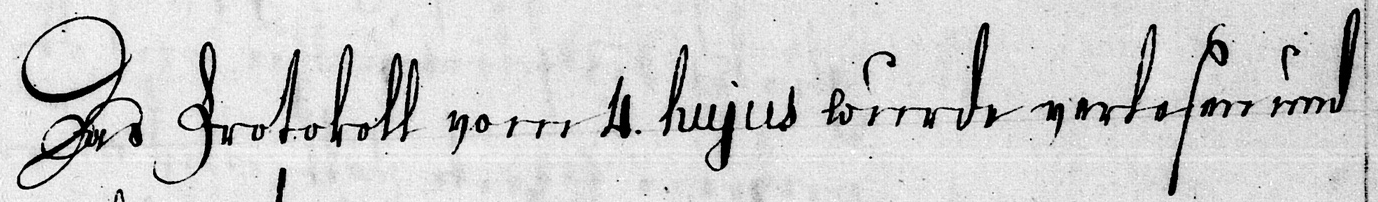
Das Protokoll vom 4. hujus wurde verlesen und
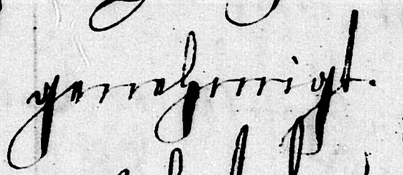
genehmigt.
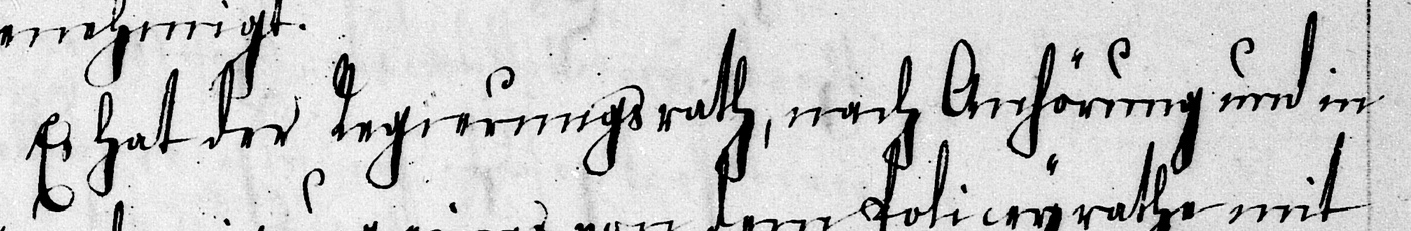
Es hat der Regierungsrath, nach Anhörung und in
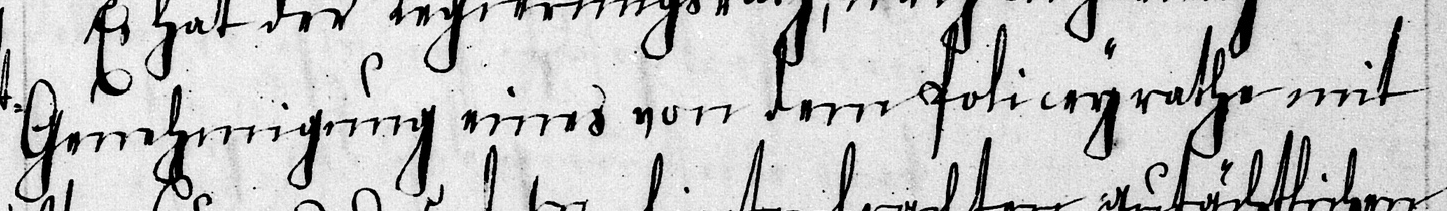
Genehmigung eines von dem Policeyrathe mit
